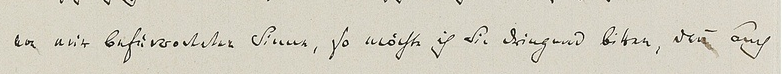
von mir befürworteten Sinne, so möchte ich Sie dringend bitten, dann auch
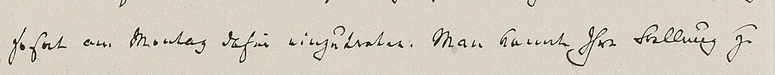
sofort am Montag dafür einzutreten. Man kennt Ihre Stellung zu
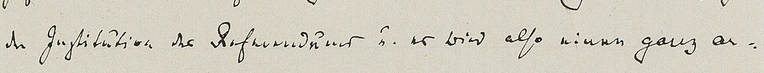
der Institution des Referendums u. es wird also einen ganz an-
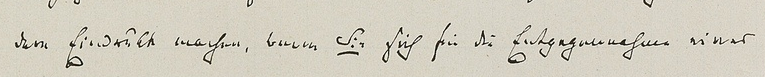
dern Eindrukk machen, wenn Sie sich für die Entgegennahme eines
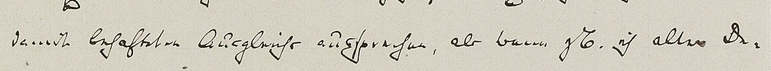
damit behafteten Ausgleichs aussprechen, als wenn zB. ich alter De-
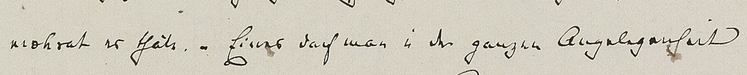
mokrat es thäte. – Eines darf man in der ganzen Angelegenheit
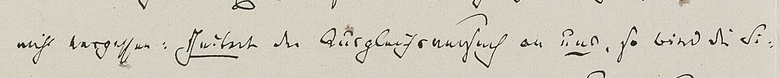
nicht vergessen: scheitert der Ausgleichsversuch an uns, so wird die Si-
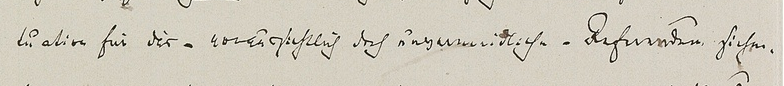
tuation für das – voraussichtlich doch unvermeidliche – Referendum sicher-
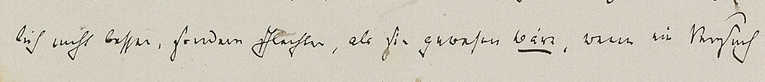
lich nicht besser, sondern schlechter, als sie gewesen wäre, wenn ein Versuch
